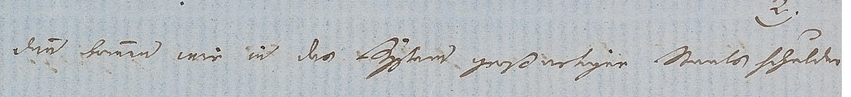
dann kommen wir in das System großartiger Staatsschulden
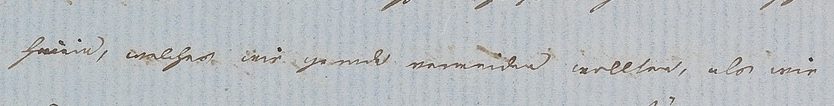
hinein, welches wir gerade vermeiden wollten, als wir
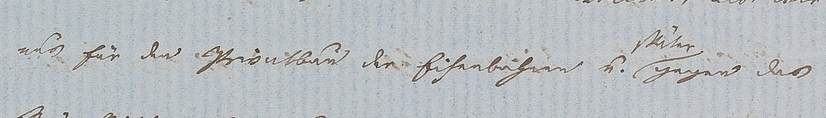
uns für den Privatbau der Eisenbahnen u. später gegen das
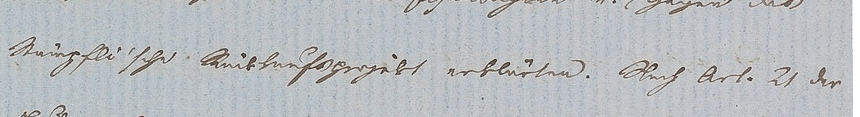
Stämpfli 'sche Rückkaufsprojekt erklärten. Nach Art. 21 der
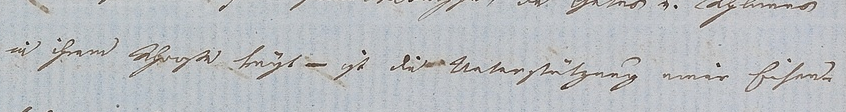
in ihrem Schooße trägt – ist die Unterstützung einer Eisen-
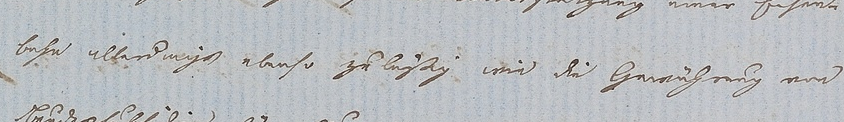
bahn allerdings ebenso zuläßig wie die Gewährung von
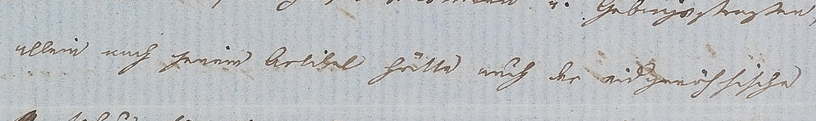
allein nach jenem Artikel hätte auch der eidgenössische
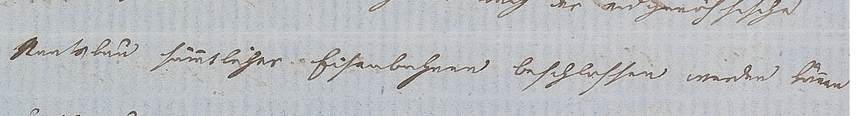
Staatsbau sämmtlicher Eisenbahnen beschlossen werden können
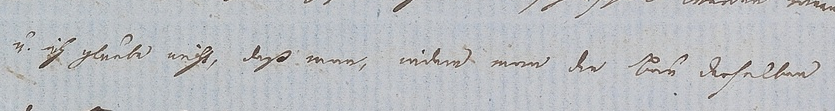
u. ich glaube nicht, daß man, indem man den Bau derselben
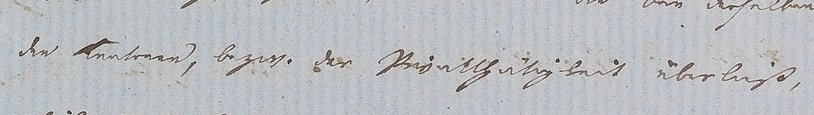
den Kantonen, bzw. der Privatthätigkeit überließ,
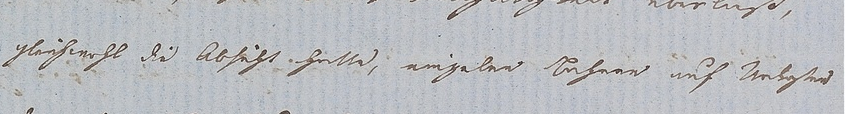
gleichwohl die Absicht hatte, einzelne Bahnen auf Unkosten
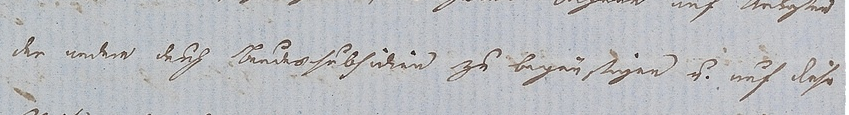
der andern durch Bundessubsidien zu begünstigen u. auf diese
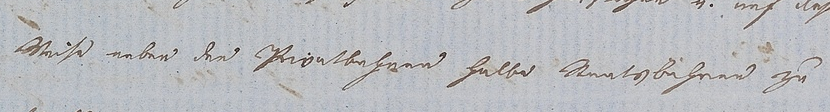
Weise neben den Privatbahnen halbe Staatsbahnen zu
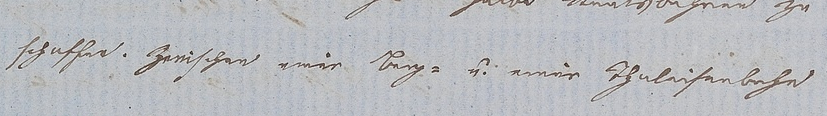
schaffen. Zwischen einer Berg- u. einer Thaleisenbahn
